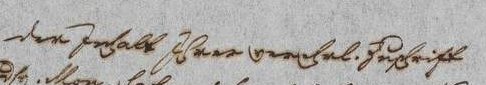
Der Inhalt Ihrer verehrl. Zuschrift
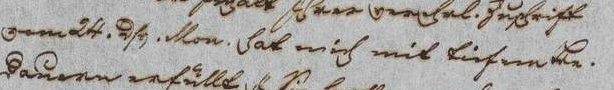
vom 24. dss. Mon. hat mich mit mit tiefem Be-
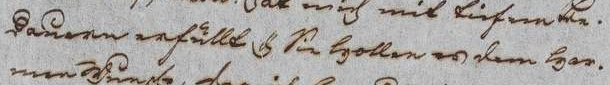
dauern erfüllt & Sie wollen es dem war-
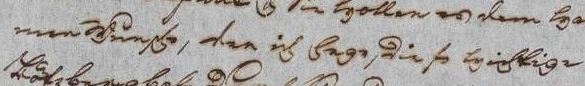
men Wunsche, den ich hege, die so wichtige
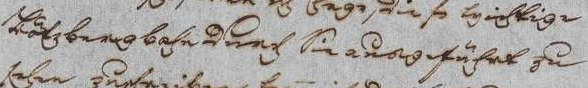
Bötzbergbahn durch Sie ausgeführt zu
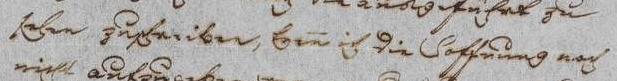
sehen, zuschreiben, wenn ich die Hoffnung noch
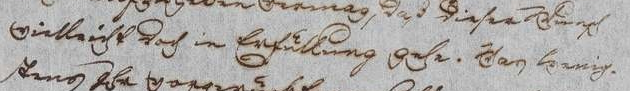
vielleicht doch in Erfüllung gehe. Was wenig-
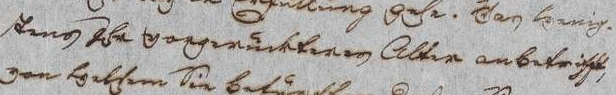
stens Ihr vorgerückteres Alter anbetrifft,
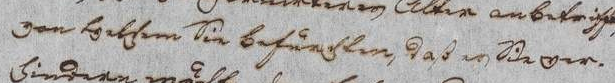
von welchem Sie befürchten, daß es Sie ver-
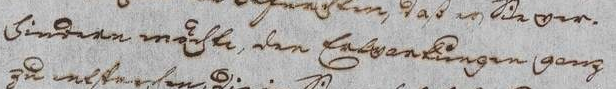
hindern möchte, den Erwartungen ganz
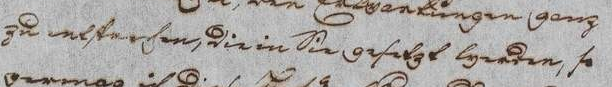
zu entsprechen, die in Sie gesetzt werden, so
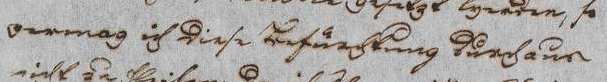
vermag ich diese Befürchtung durchaus
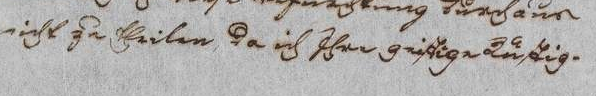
nicht zu theilen, da ich Ihre geistige Rüstig-
